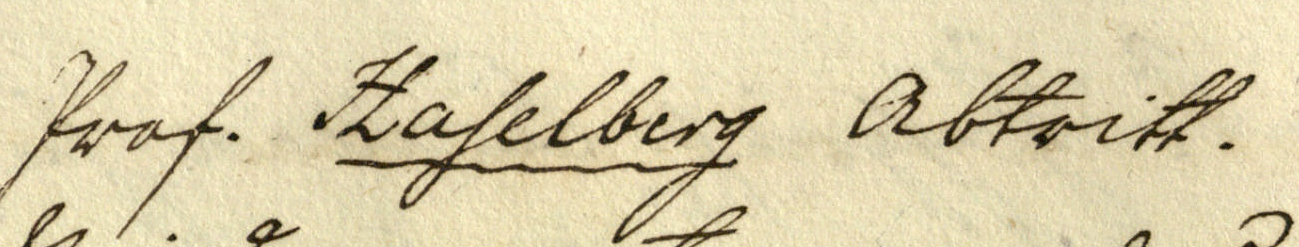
Prof. Haselberg ABtritt.
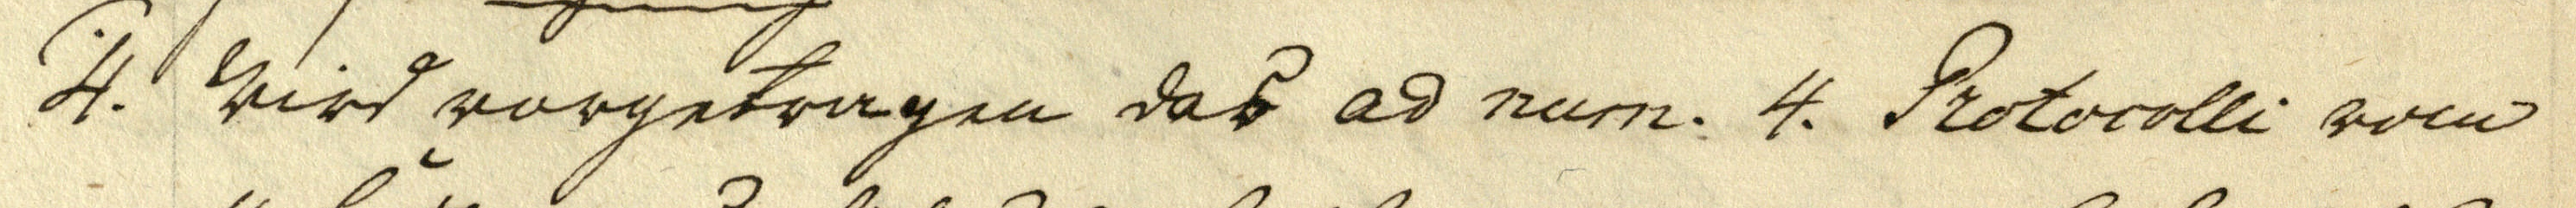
4. Wird vorgetragen das ad num. 4. Protocolle vom
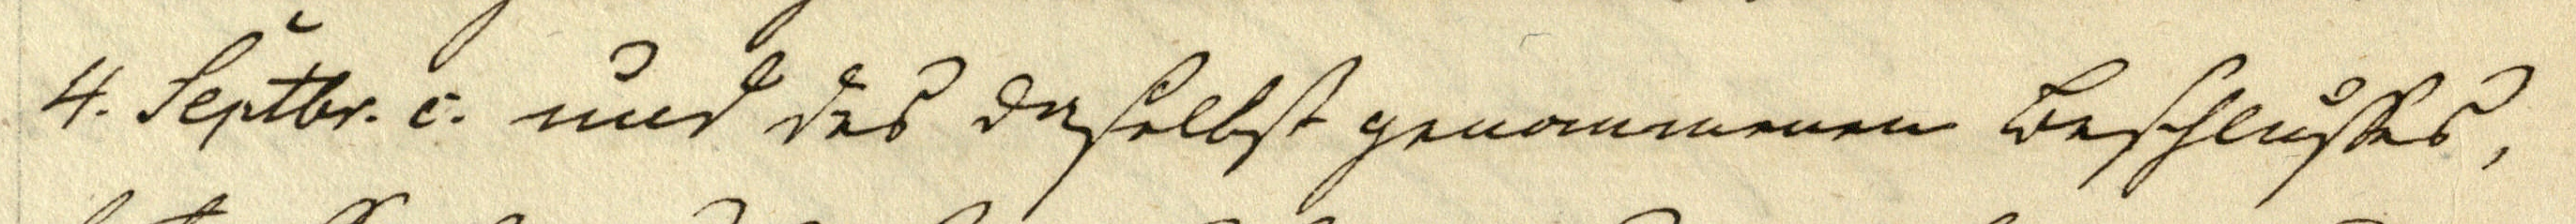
4. Septbr. c. un ddes daselbst genommenen Beschlusses
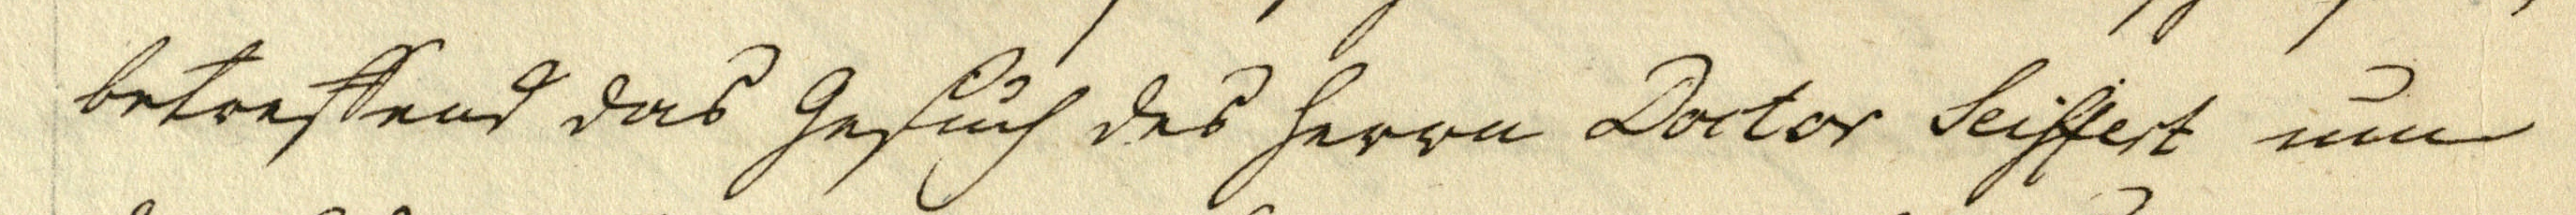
betreffend das Gesuch des herrn Doctor Seiffert um
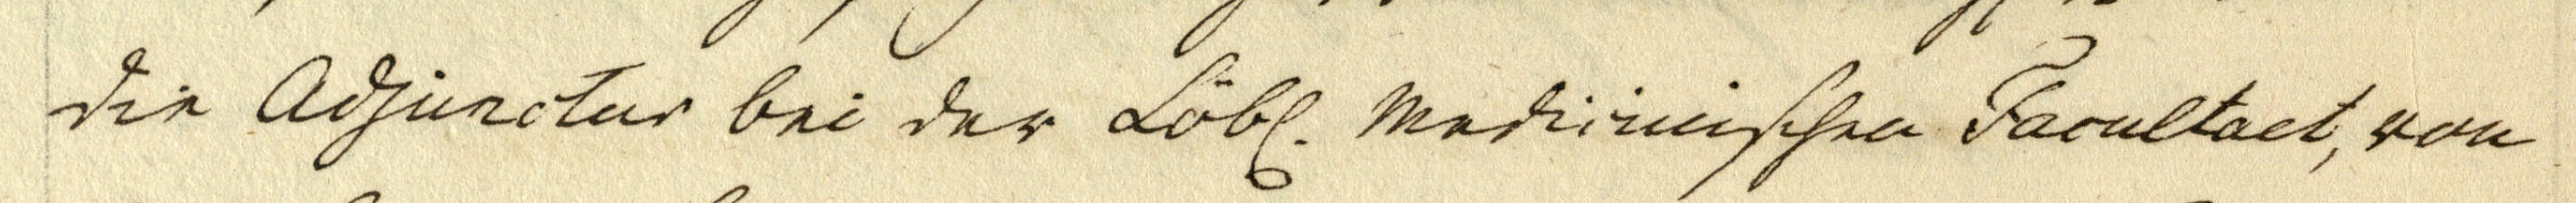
die Adjunctur bei der Löbl. Medicinischen Facultaet, von
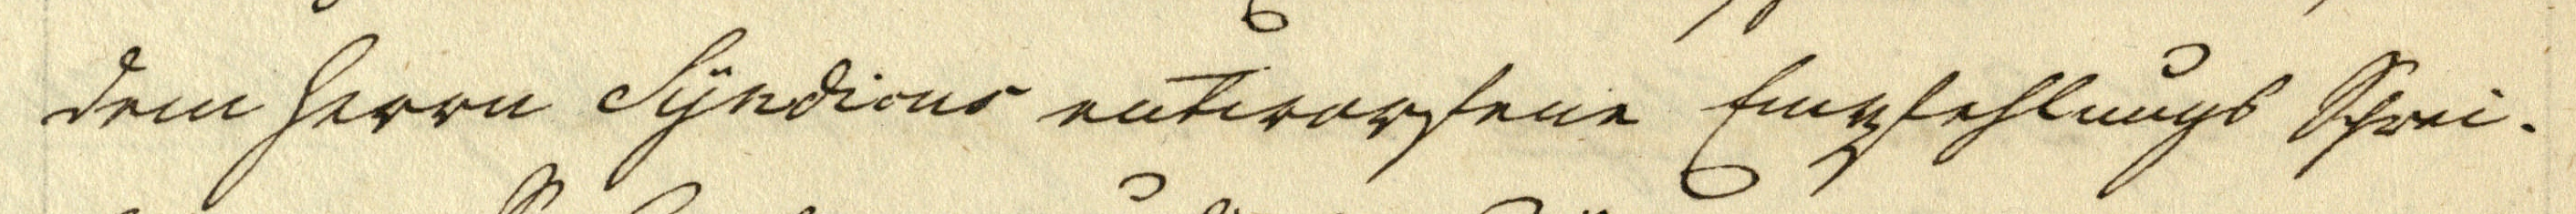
dem herrn Syndicus entworfene Empfehlungs Schrei-
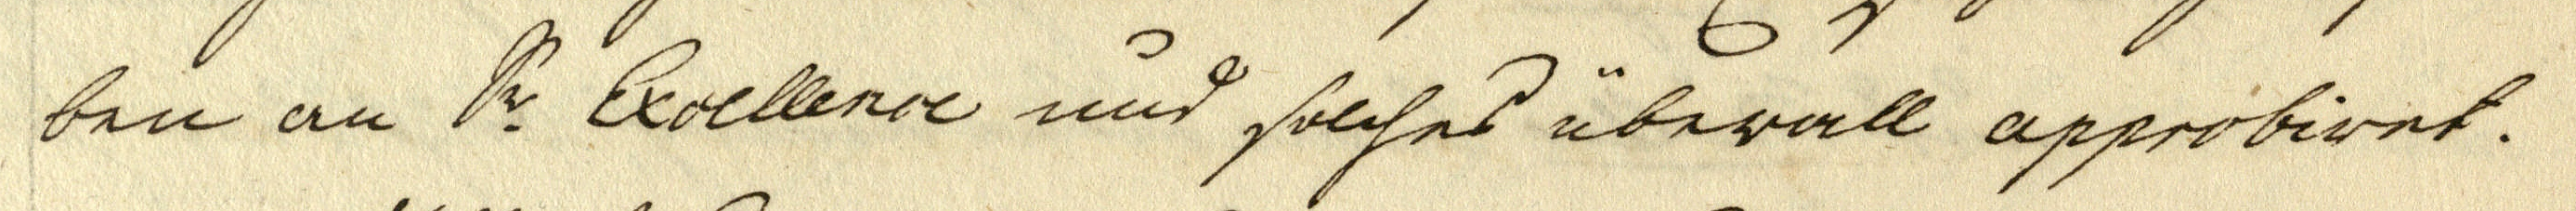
ben an Sr. Excellence und solches überall approbiret.
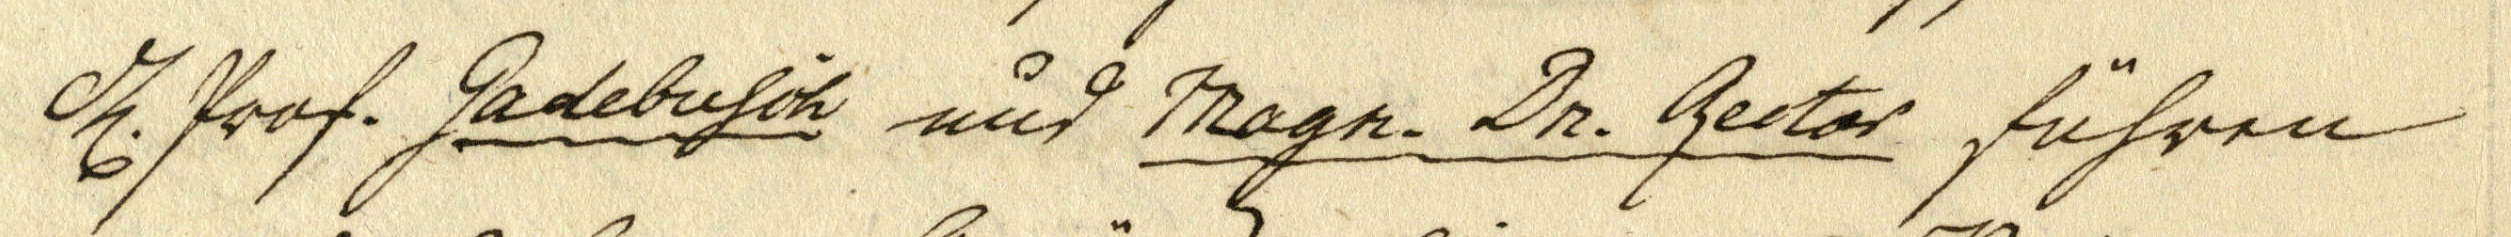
dh. Prof. Gadebusch und Magn. Dn. Rector führen
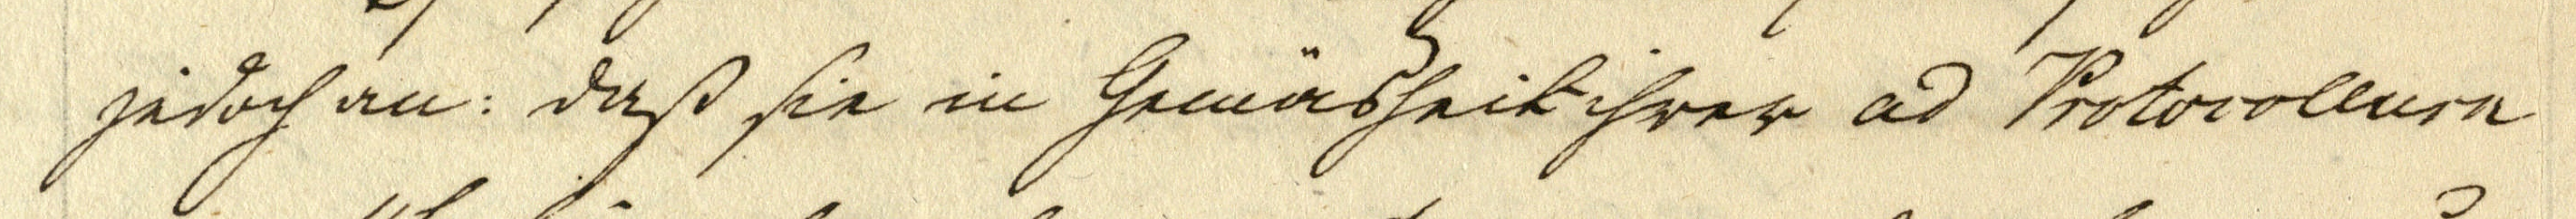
jedoch an: daß sie in Gemäsheit ihrer ad Protocollum
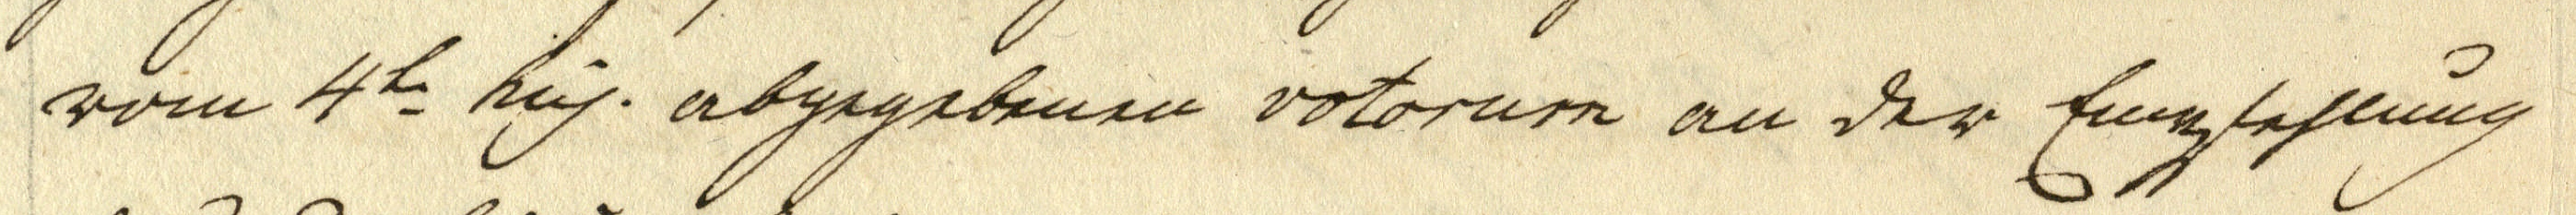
vom 4ten huj. abgegebenen votorum an der Empfehlung
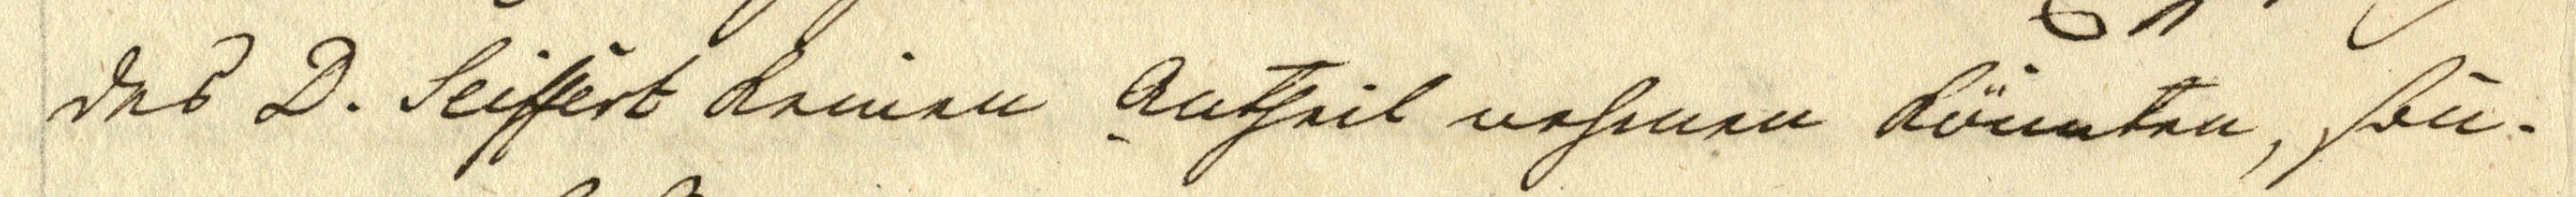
des D. Seiffert keinen Antheil nehmen könnten, son-
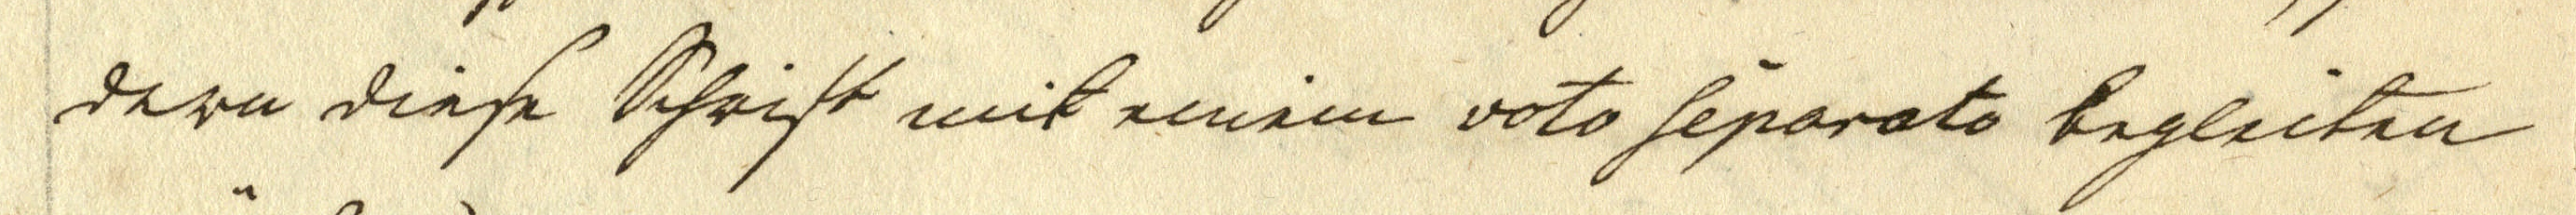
dern diese Schrift mit einem voto separato begleiten
